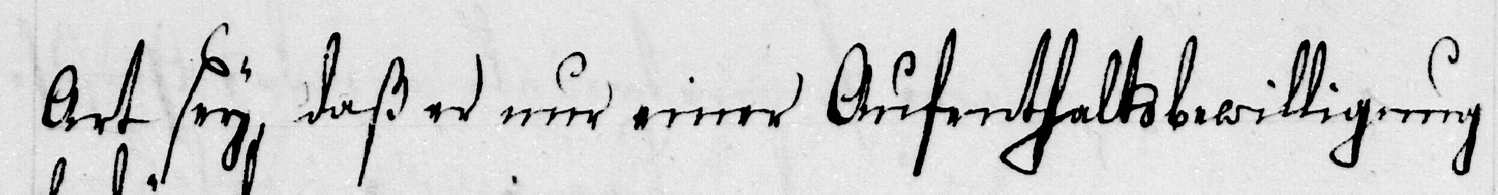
Art sey, daß er nur einer Aufenthaltsbewilligung
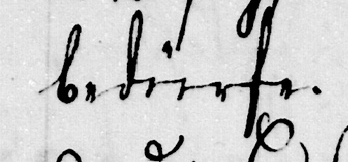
bedürfe.
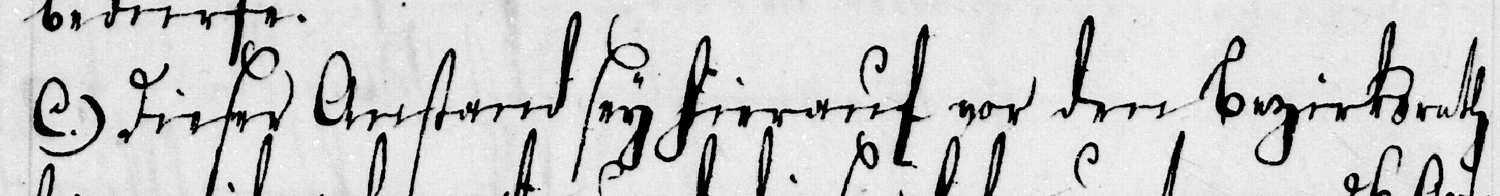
C.) Dieser Anstand sey hierauf von den Bezirksrath
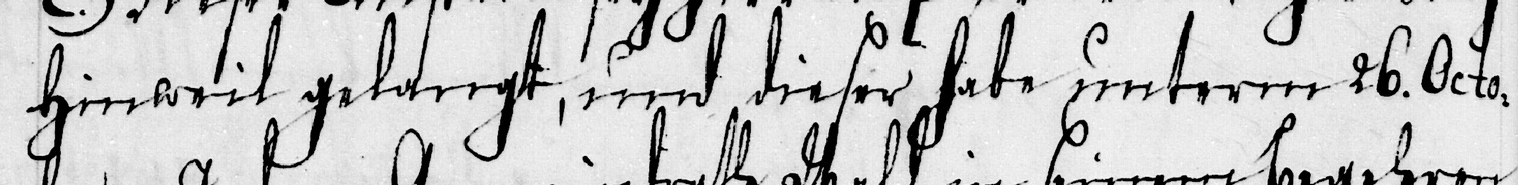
Hinweil gelangt, und dieser habe unterm 26. Oct¬
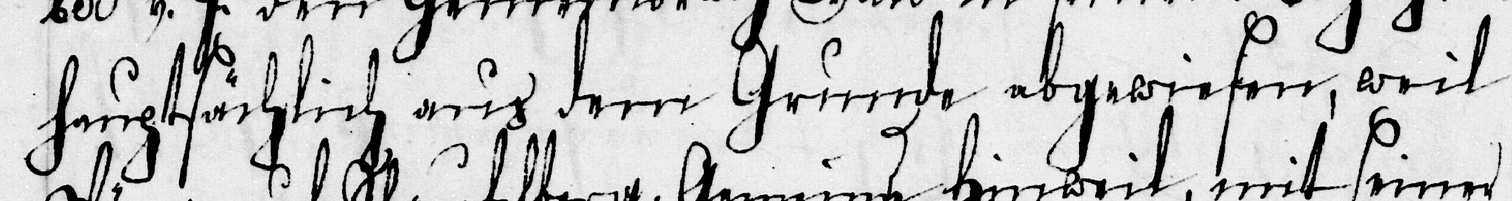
hauptsächlich aus dem Grunde abgewiesen, weil
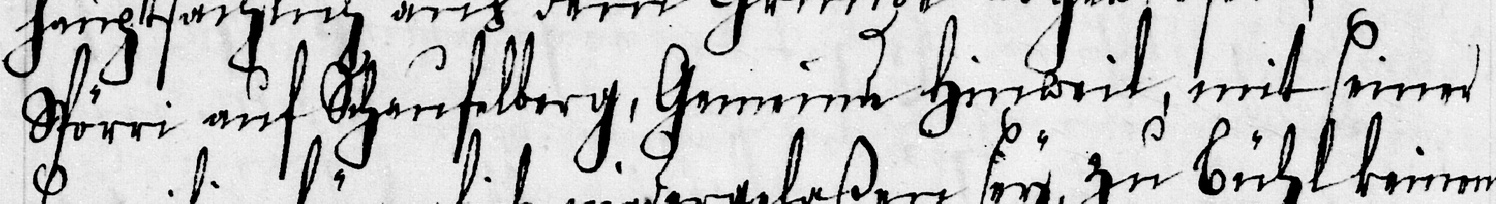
Spörri auf Schaufelberg, Gemeinde Hinweil, mit seiner
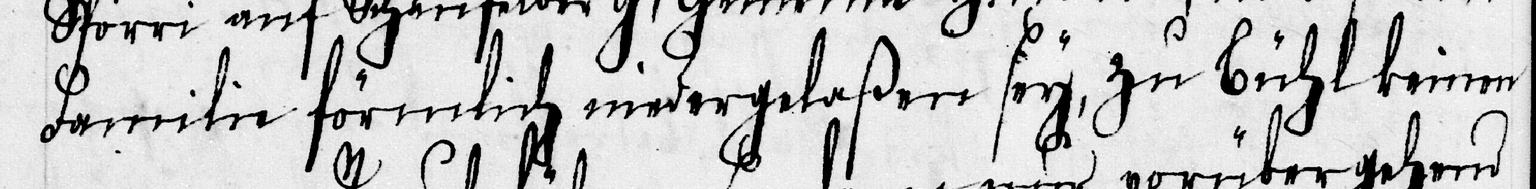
Familie förmlich niedergelaßen sey, zu Bühl keinen
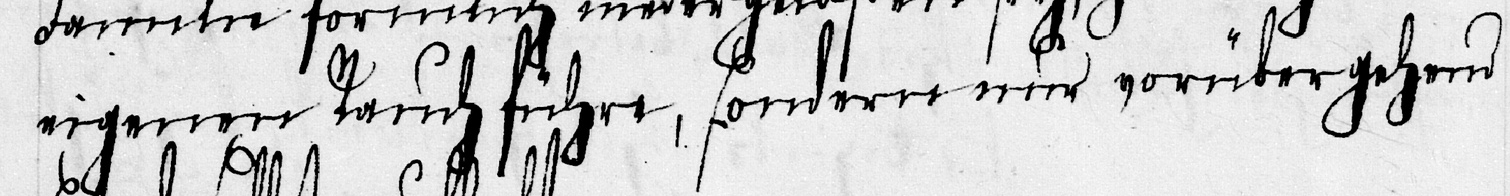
eigenen Rauch führe, sondern nur vorübergehend
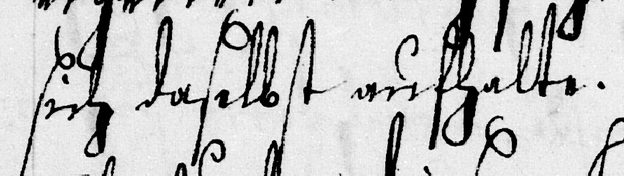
sich daselbst aufhalte.
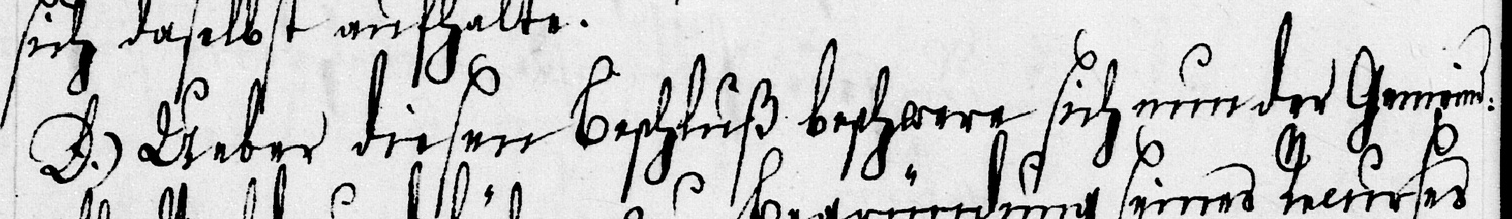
D.) Ueber diesen Beschluß beschwere sich nun der Gemein¬
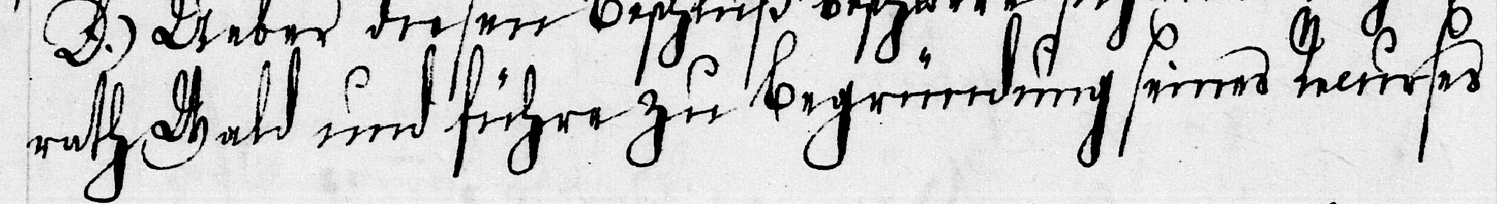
drath Wald und führe zu Begründung seines Recurses
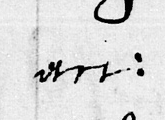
an:
